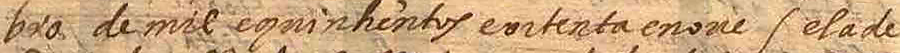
bro de mil e quinhēntos e oitenta e noue / el ade
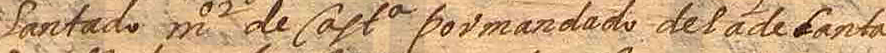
lantado mor de Casta por mandado del adelanta
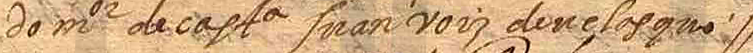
do mor de casta Juan roiz de uelasquo. //.
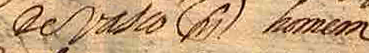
De Vasco frz̄ homem
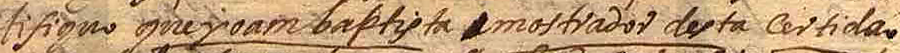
tifiquo que yoam baptista _mostrador desta certidaõ
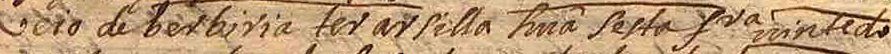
veio de berbiria ter arsilla huā sesta fra uinte do
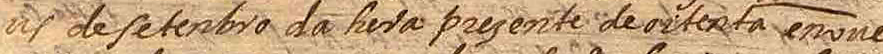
us de setenbro da hera prezente de oitenta e noue
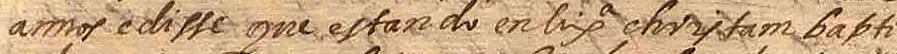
annos e disse que estando en lixa christam bapti
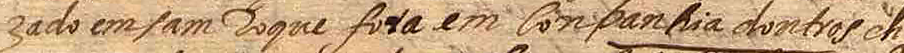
zado em sam Roque fora em Conpanhia doutros ch
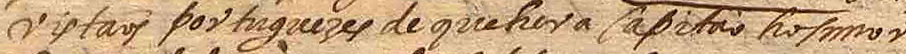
ristaos portuguezes de que hera Capitao ho senor̄
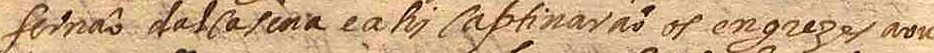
fernaõ dalcaseua e ahi Captiuaraõ os engrezes a ou
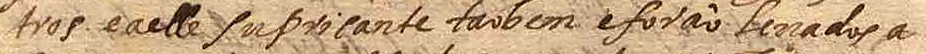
tros e a elle supricante taobem e forão leuados a
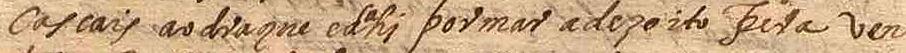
Cascais ao draque e dahj por mar a dezoito pera ven
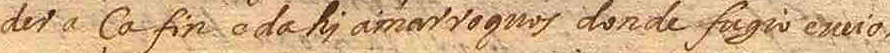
der a Çafin e dahj a marroquos donde fugio e ueio.
